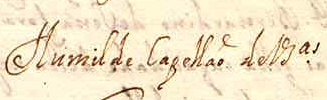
Humilde Capellaõ de V S.as
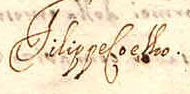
Filippe Coelho.
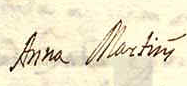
Anna Martin̄s
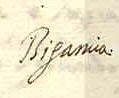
Bigamia.
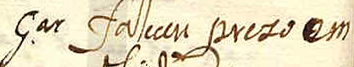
G.ar faleceu prezo em
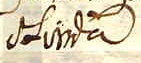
oLinda
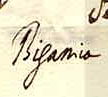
Bigamia
